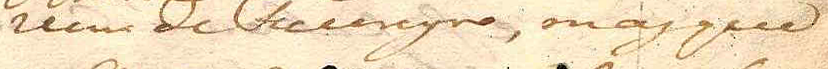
uem de Feuereyro, mas que
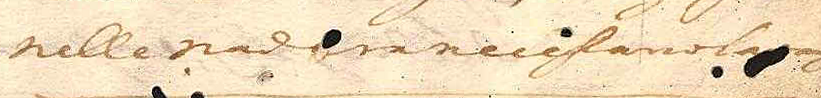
nelle naõ era necessario
